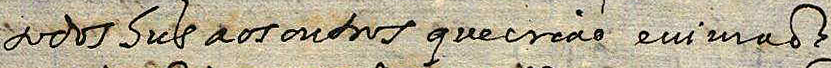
todos hus̄ aos outros que criaõ e uiuiaõ
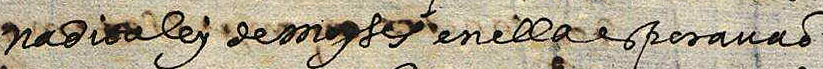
na dita ley de moyses e nella esperauaõ
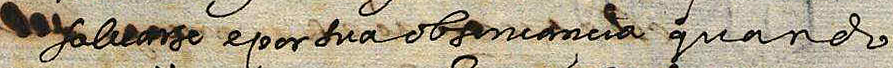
saluarse e por sua obseruançia quando
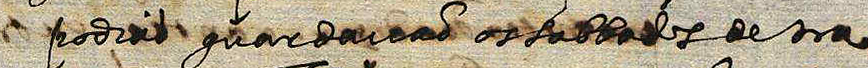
podiaõ guardauaõ os sabbados de tra
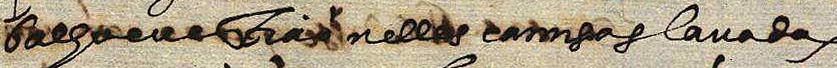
balho e uestiaõ nelles camisas lauadas
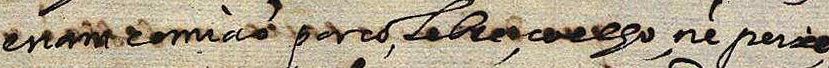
e nam comiaõ porco, lebre, coelho, nē peixe,
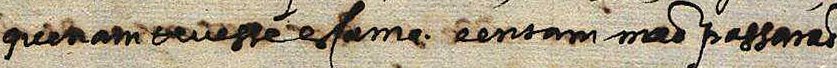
que nam teuesse esCama. e entam naõ passaraõ
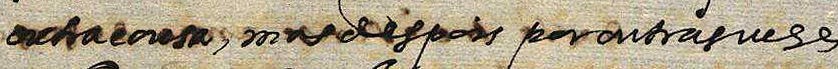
outra cousa, mas despois por outras uezes
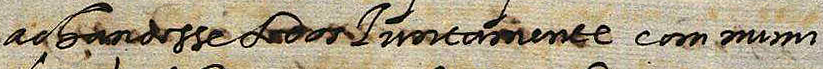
açhandosse todos Iuntamente communi
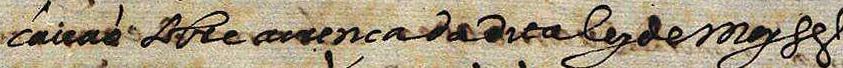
cauaõ sobre a crença da dita ley de Moyses
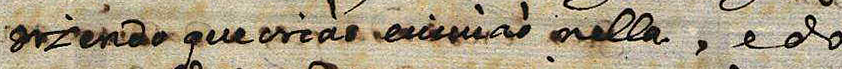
dizendo que crião e uiuiaõ nella, e do
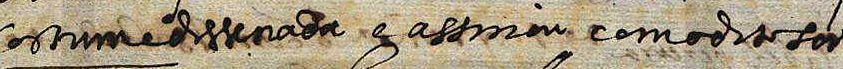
costume disse nada e assinou com o dito sōr
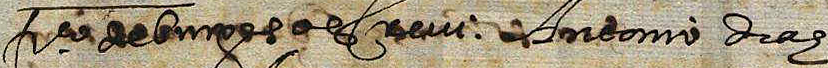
fr.co de burges o esCreui. Antonio diaz
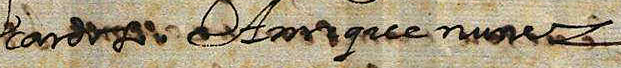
cardoso. Anrique nunez
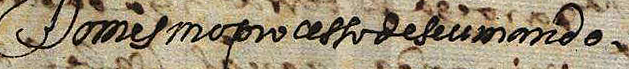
Do mesmo processo de seu marido.
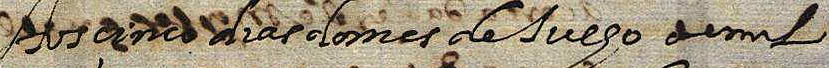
Aos çinco dias do mes de Iulho de miL
